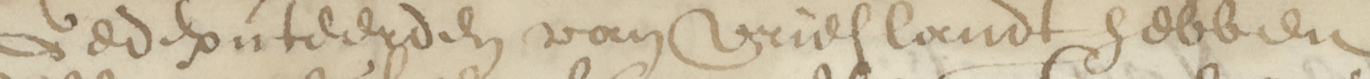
Gedeputeerden van Vrieslandt hebben
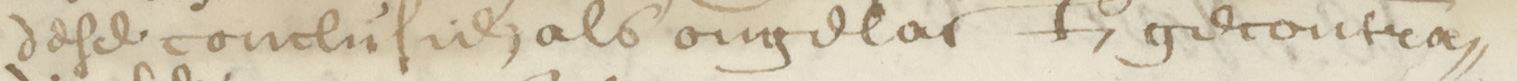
dese conclusie, als ongelast, gecontra,,
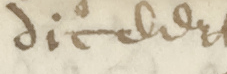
diceert.
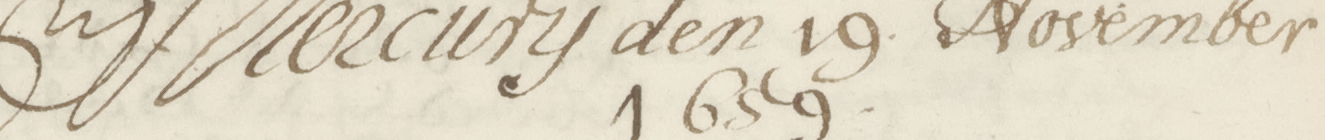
Mercurij den 19e. November
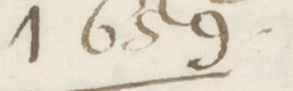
1659.
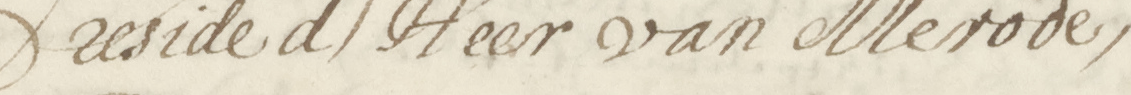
Preside d' Heer van Merode,
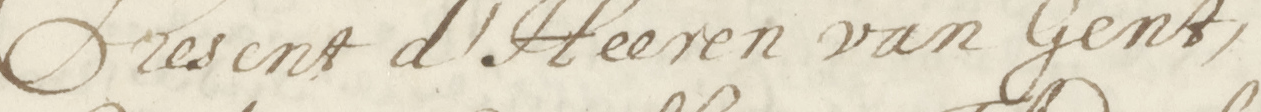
Present d' Heeren van Gent,
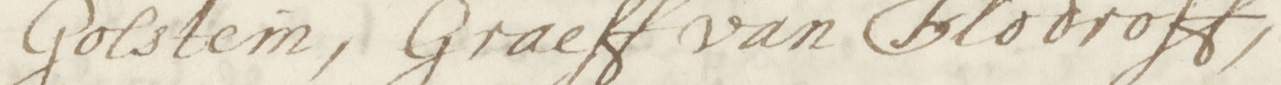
Golstein, Graeff van Flodroff,
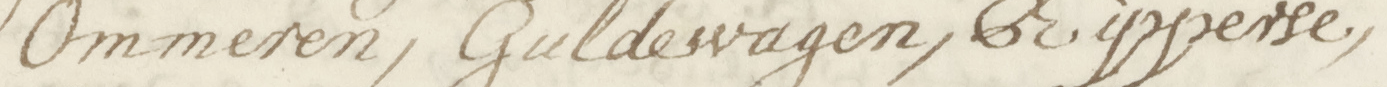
Ommeren, Guldewagen, Ripperse,
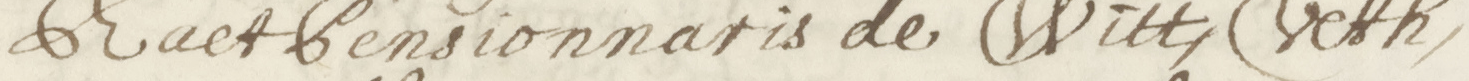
Raet Pensionnaris de Witt, Veth,
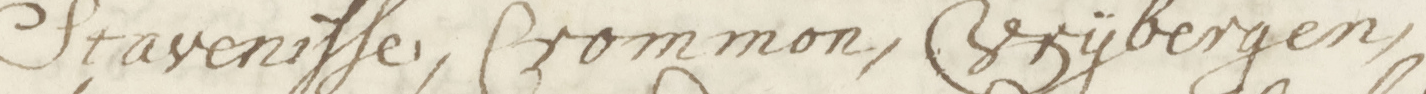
Stavenisse, Crommon, Vrijbergen,
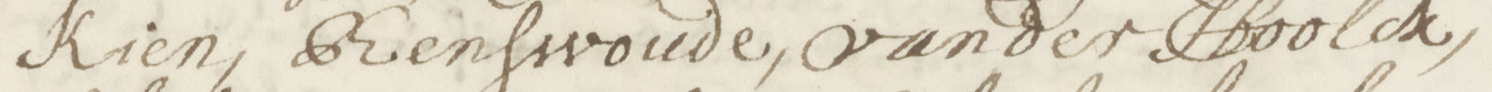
Kien, Renswoude, van der Hoolck,
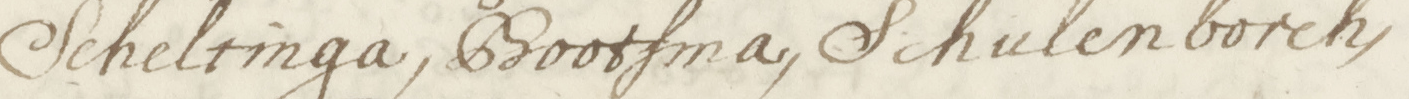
Scheltinga, Bootsma, Schulenborch.
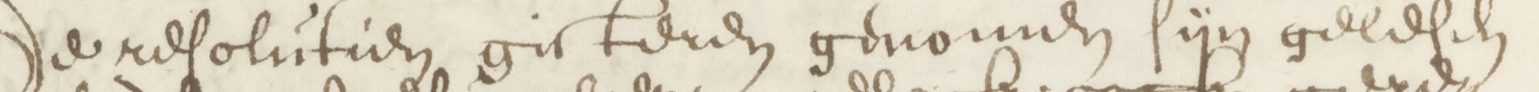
De resolutien gisteren genomen sijn gelesen
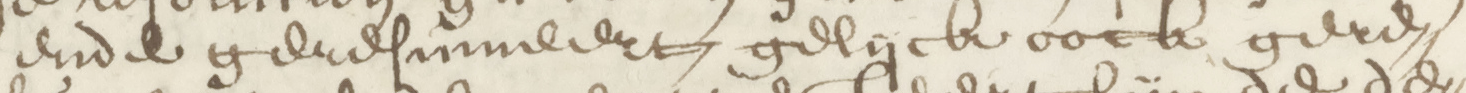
ende geresumeert, gelijck oock gere,,
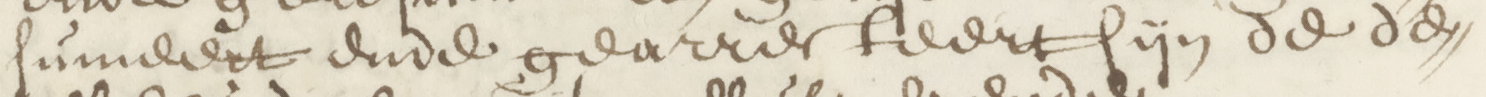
sumeert ende gearresteert sijn de de,,
